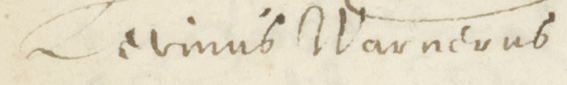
Levinus Warnerus
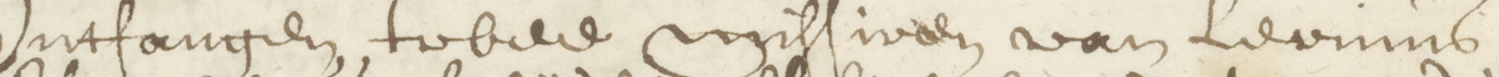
Ontfangen twee missiven van Levinus
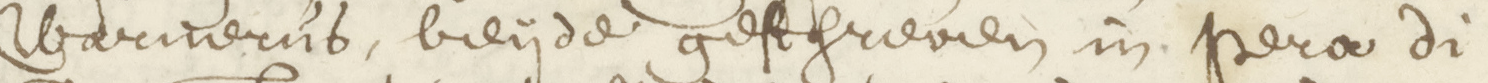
Warnerus, beijde geschreven in Pera di
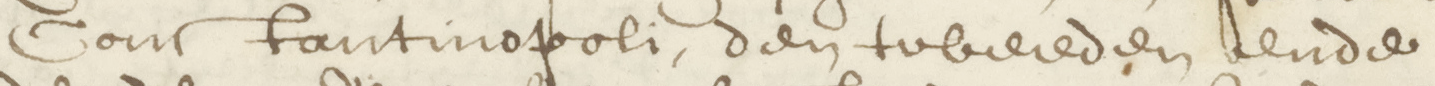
Constantinopoli, den tweeden ende
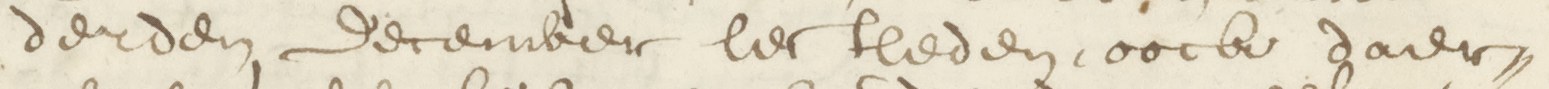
derden December lestleden, oock daer„
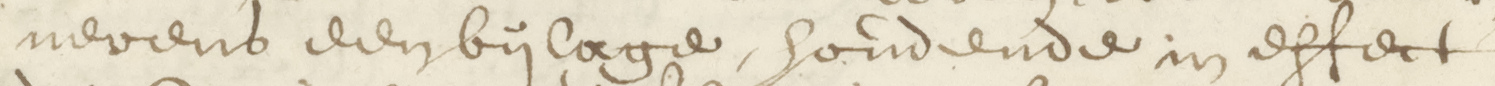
nevens een bijlage, houdende in effect
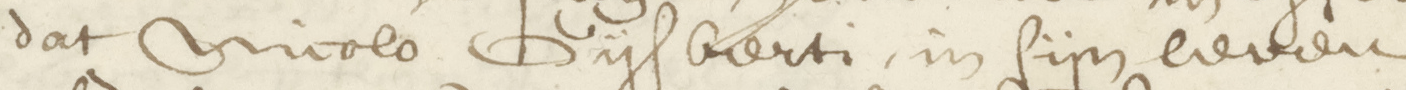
dat Nicolo Gijsberti, in sijn leven
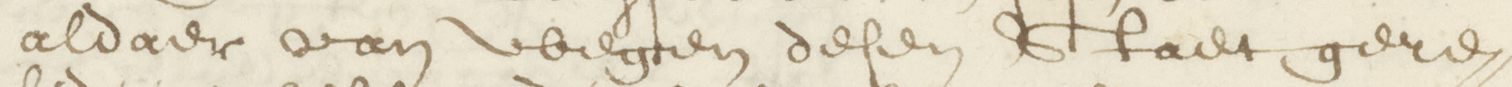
aldaer van wegen desen Staet gere„
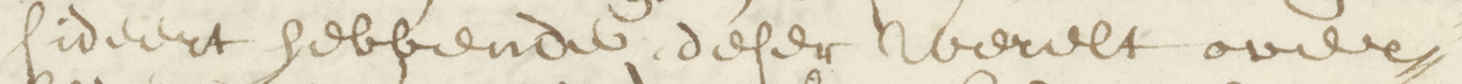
sideert hebbende deser Werelt over„
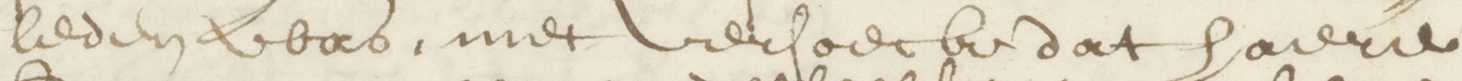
leden was, met versoeck dat haere
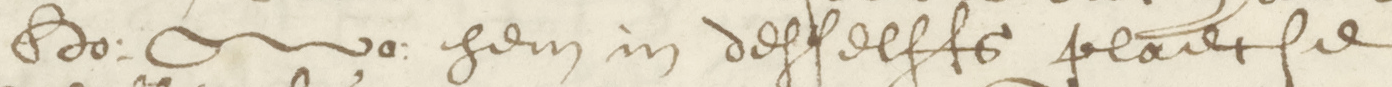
Ho:Mo: hem in desselffs plaetse
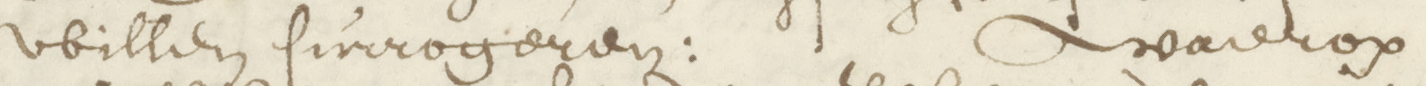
willen surrogeren: Waerop
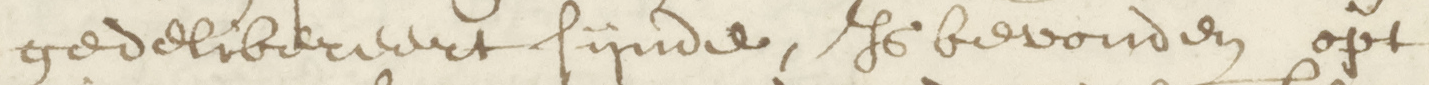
gedelibereert sijnde, Is bevonden opt
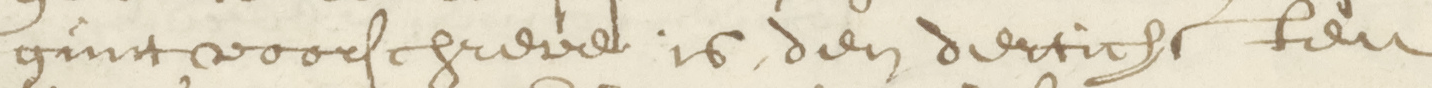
gunt voorschreve is, den dertichsten
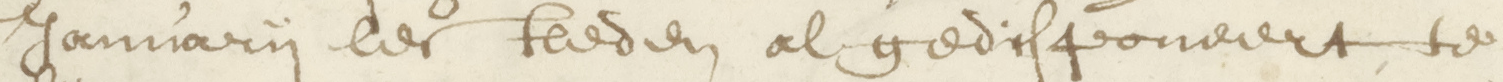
Januarij lestleden al gedisponeert te
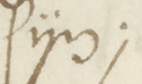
sijn.
